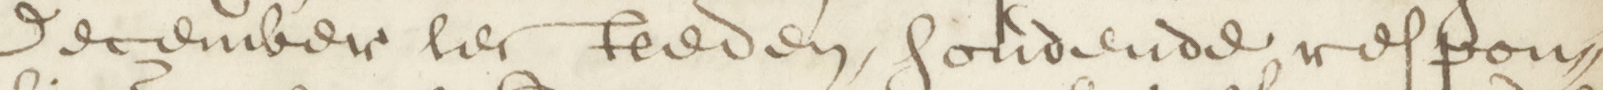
December lestleden, houdende respon„
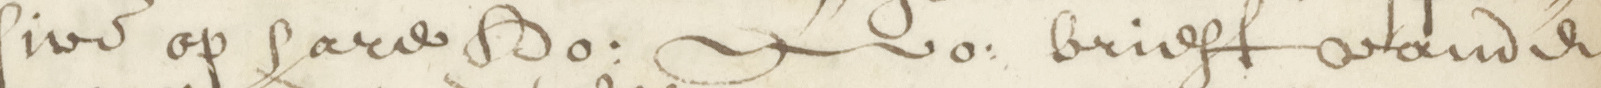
sive op hare Ho:Mo: brieff vanden
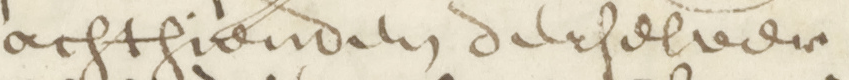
achthienden derselver Maent,
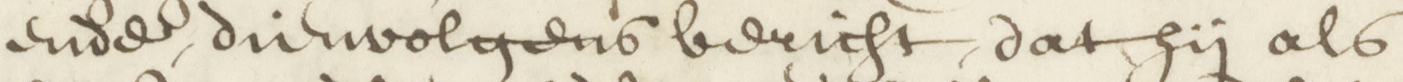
ende, dienvolgens bericht, dat hij als
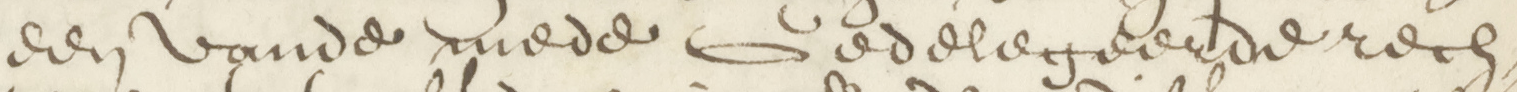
een vande mede Gedelegeerde rech„
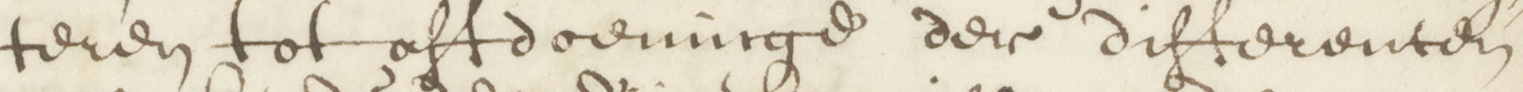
teren tot affdoeninge der differenten
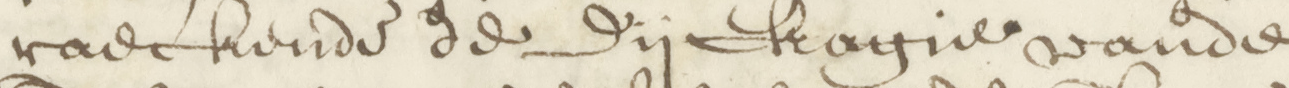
raeckende de Dijckagie vande
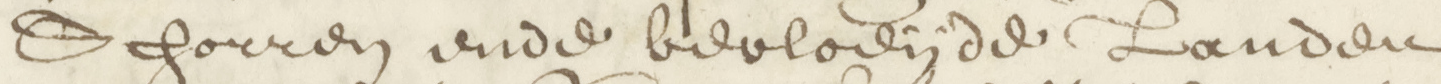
Schorren ende bevloeijde Landen,
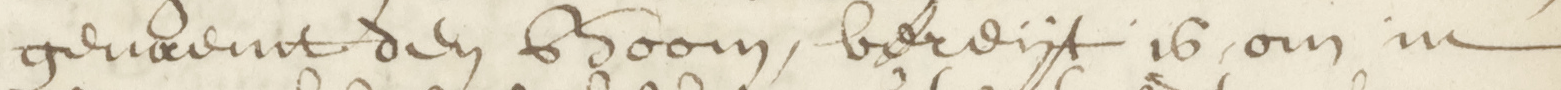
genaemt den Boom, bereijt is, om in
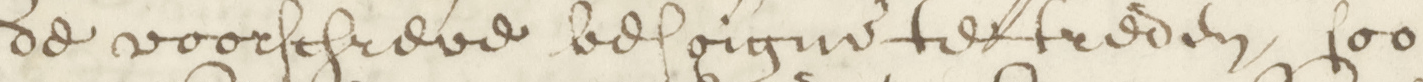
de voorschreve besoigne te treden, soo
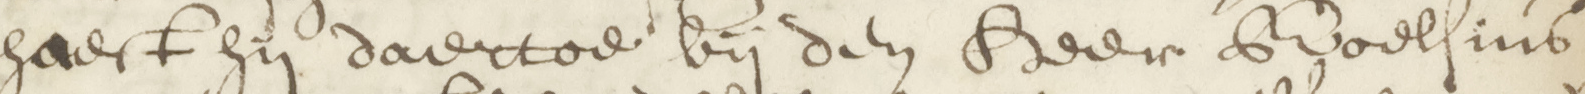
haest hij daertoe bij den Heer Roelsius
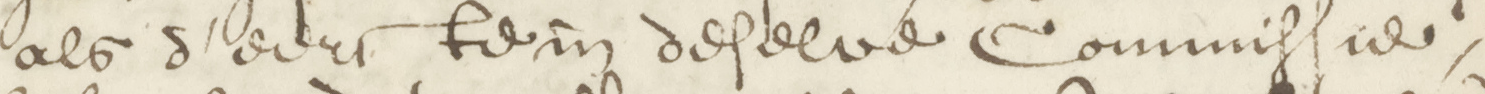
als d'eerste in deselve Commissie
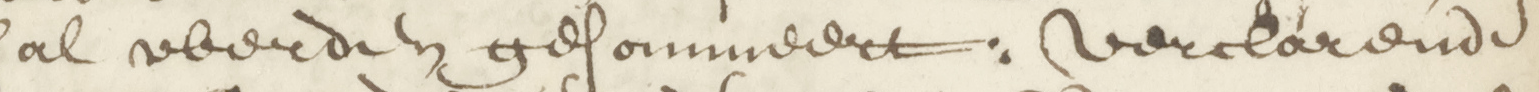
sal werden gesommeert: Verclarende
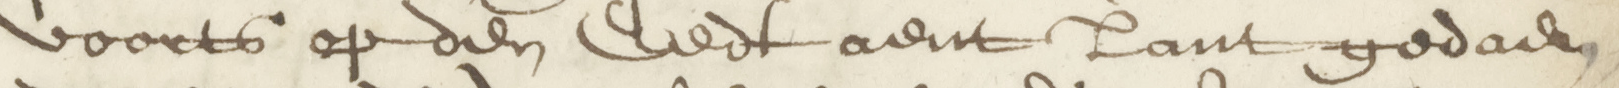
voorts op den Eedt aent Lant gedaen,
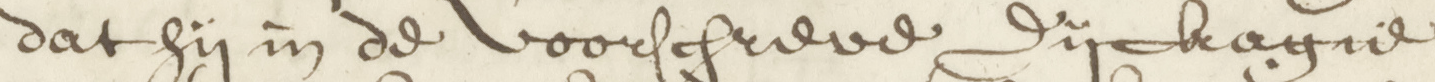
dat hij in de voorschreve Dijckagie,
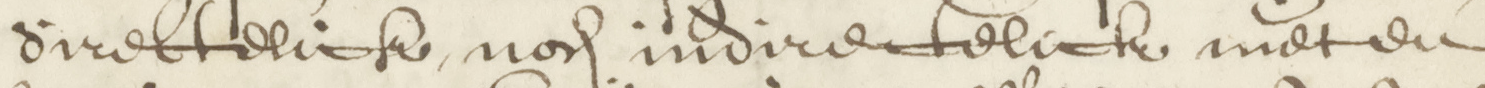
directelick, noch indirectelick niet en
